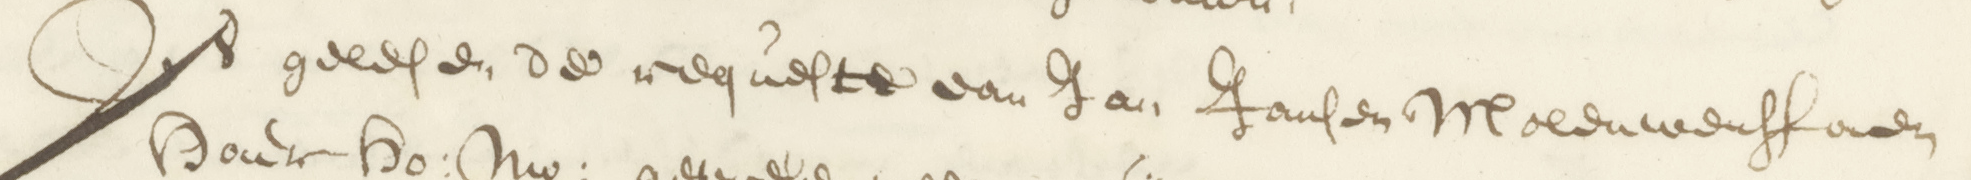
Is gelesen de requeste van Jan Jansen Molenwerff aen
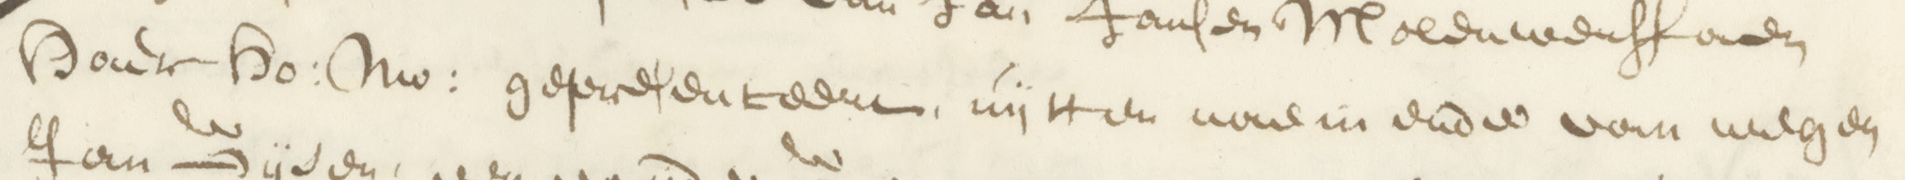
haer Ho:Mo: gepresenteert, uijtten naem ende van wegen
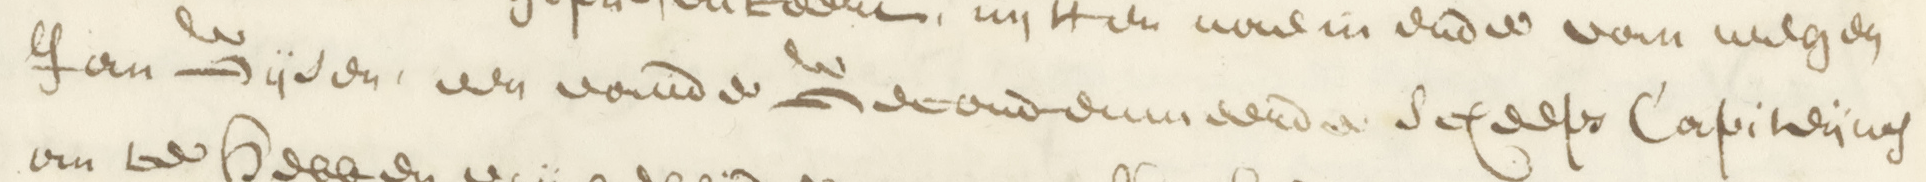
Jan Gijsen, een vande Gecondemneerde scheeps Capiteijnen
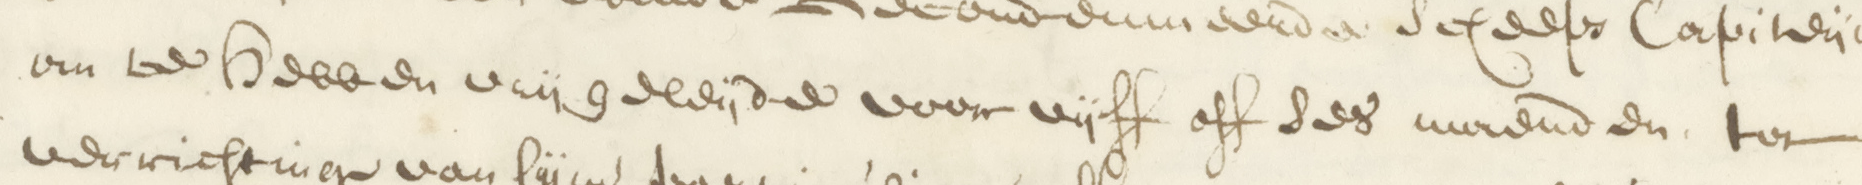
om te hebben vrijgeleijde voor vijff off ses maenden tot
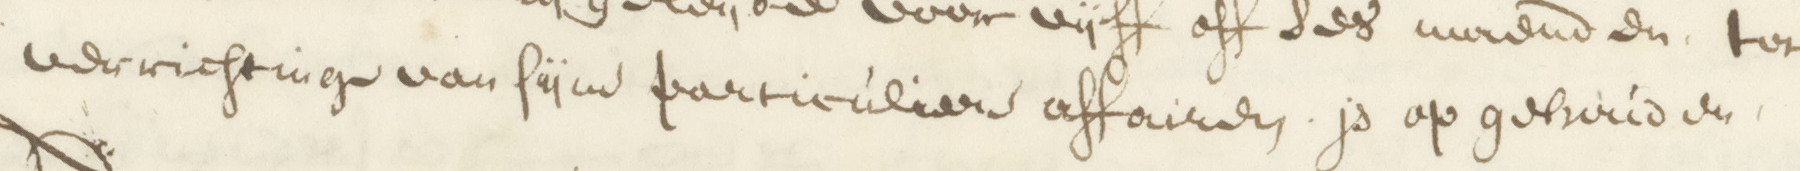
verrichtinge van sijne particuliere affairen, is op gehouden.
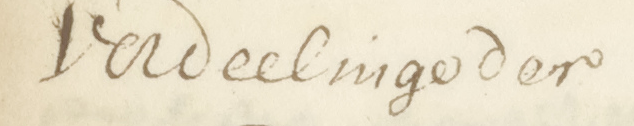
Verdeelinge der
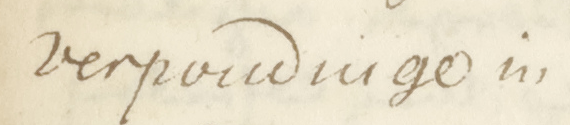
verpondinge in
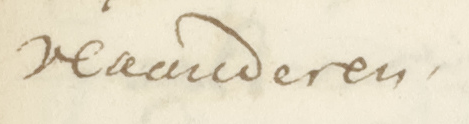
Vlaenderen
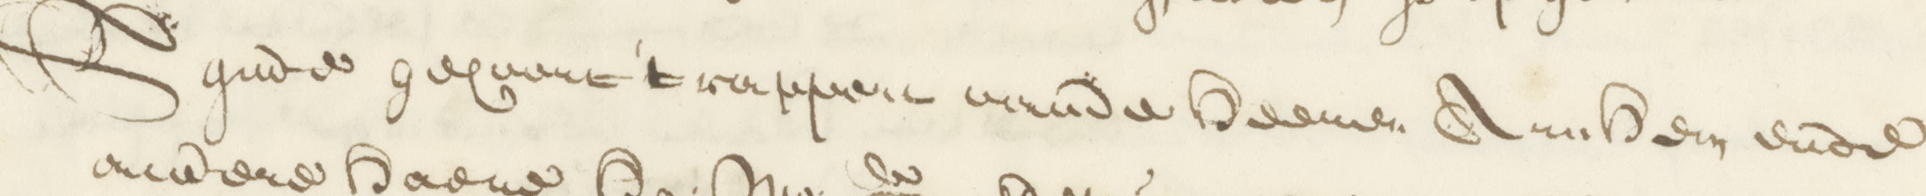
Sijnde gehoort 't rapport vande heeren Arnhem ende
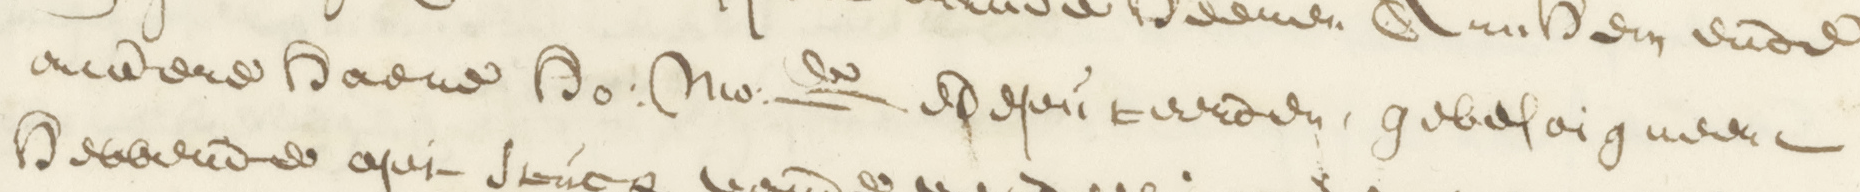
andere haere Ho:Mo: Gedeputeerden, gebesoigneert
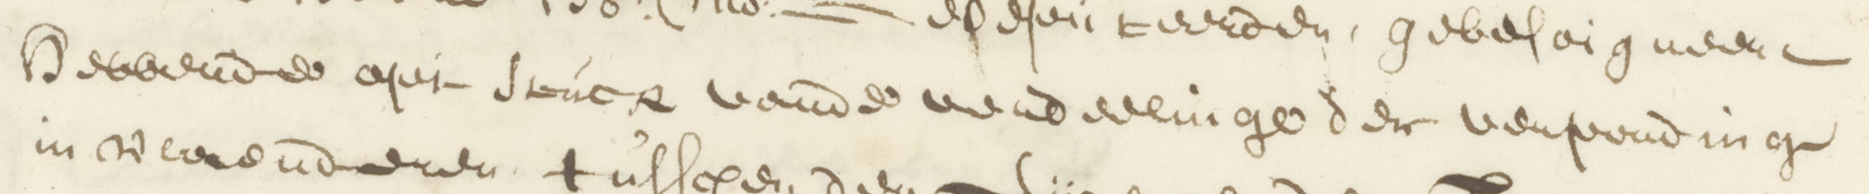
hebbende opt stuck vande verdeelinge der verpondinge
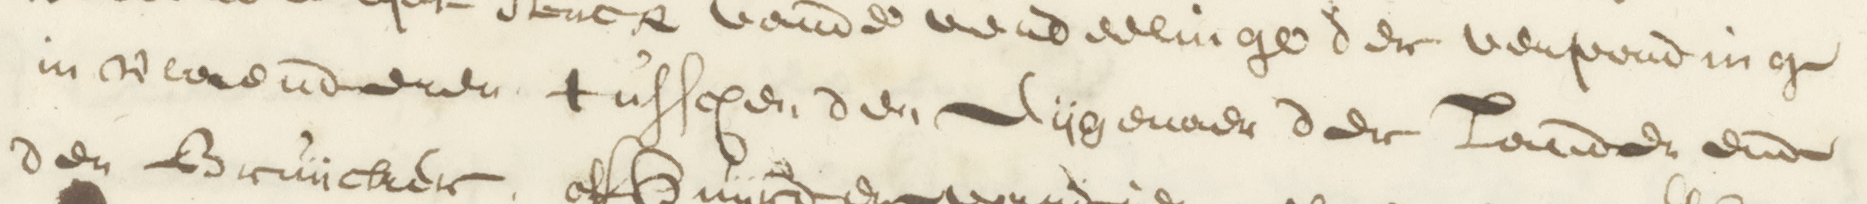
in vlaenderen tusschen den Eijgenaer der Landen ende
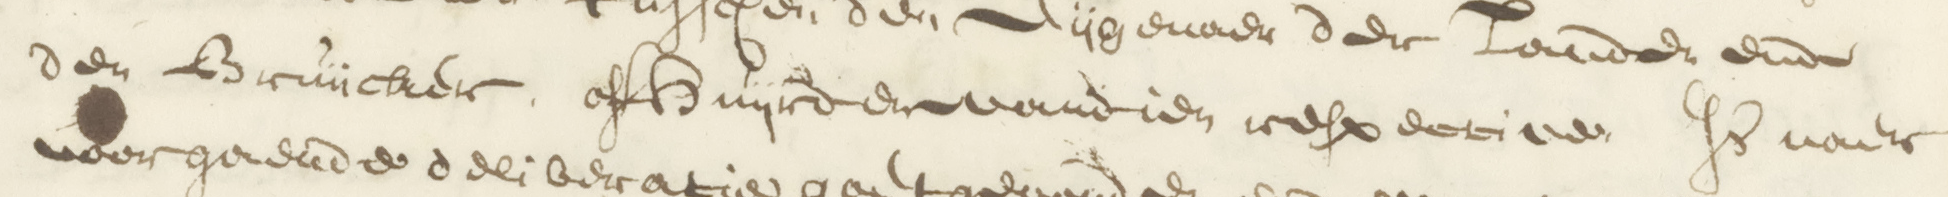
den Bruijcker of Huijrder vandien respective. Is naer
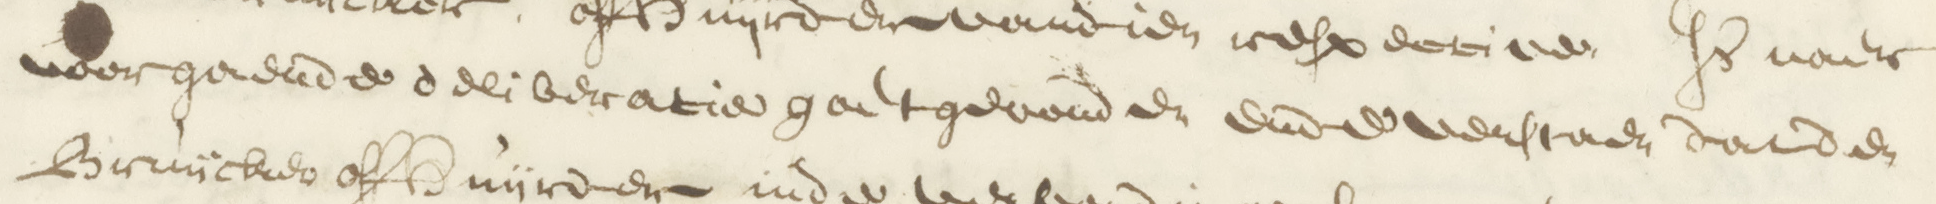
voorgaende deliberatie goetgevonden ende verstaen dat den
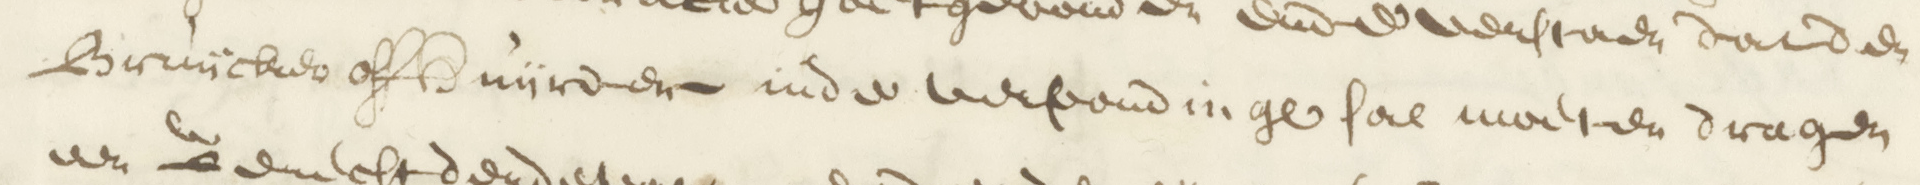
bruijcker off huijrder inde verpondinge sal moeten dragen
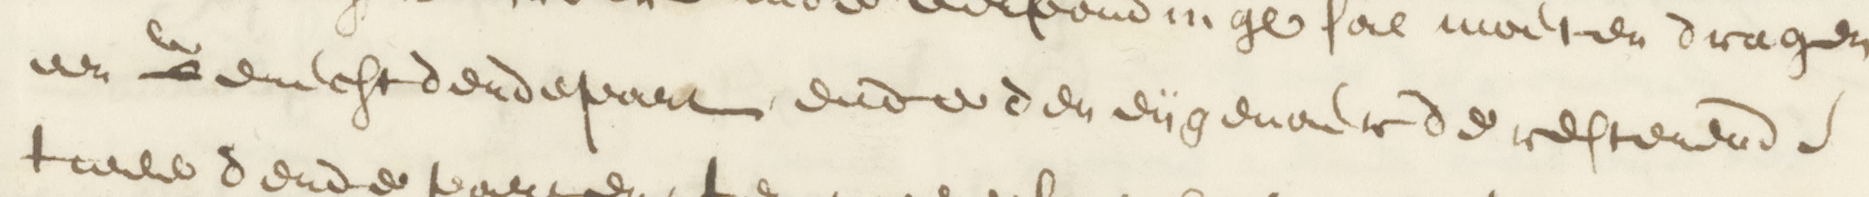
een Gerecht derdepart, ende den eijgenaer de resterende
